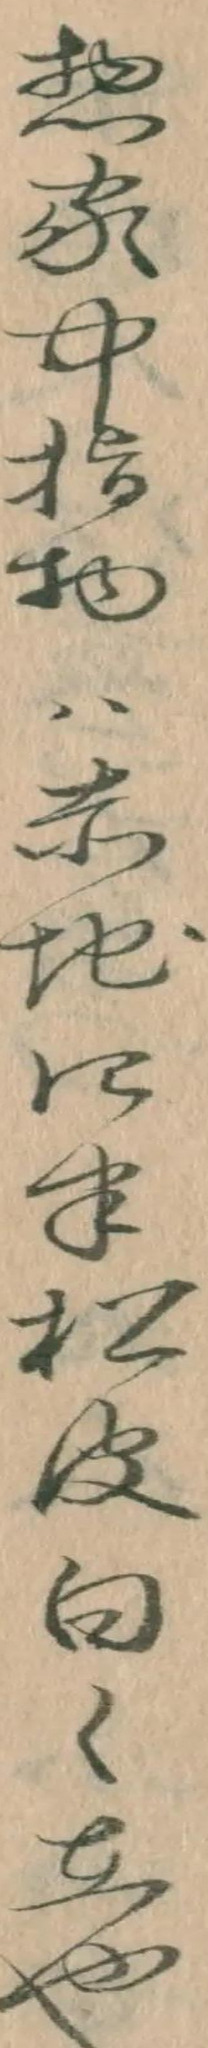惣家中指物は赤地四半松皮白く在や
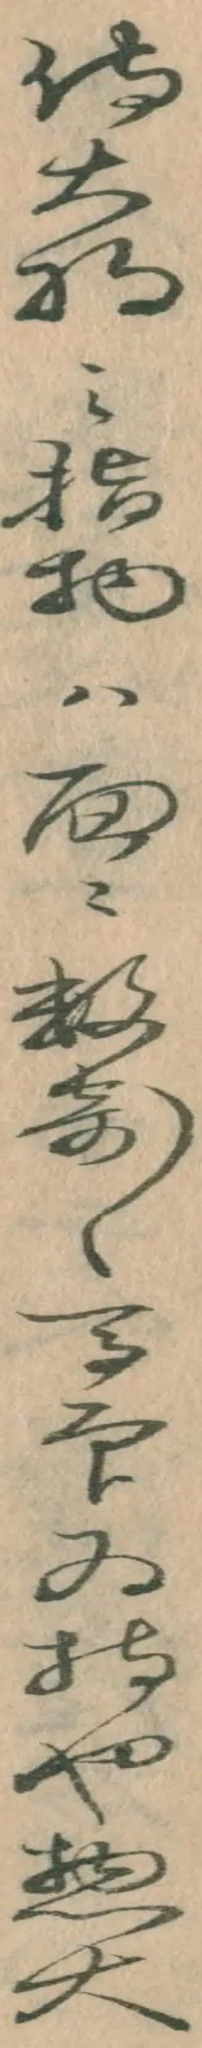侍大将之指物は面々数寄〱馬印ゐ持や惣大
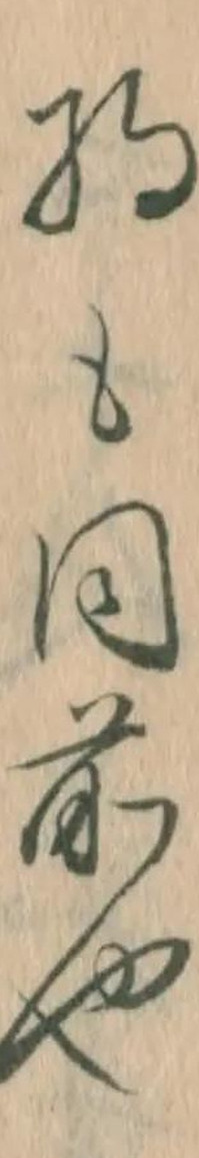将も同前也
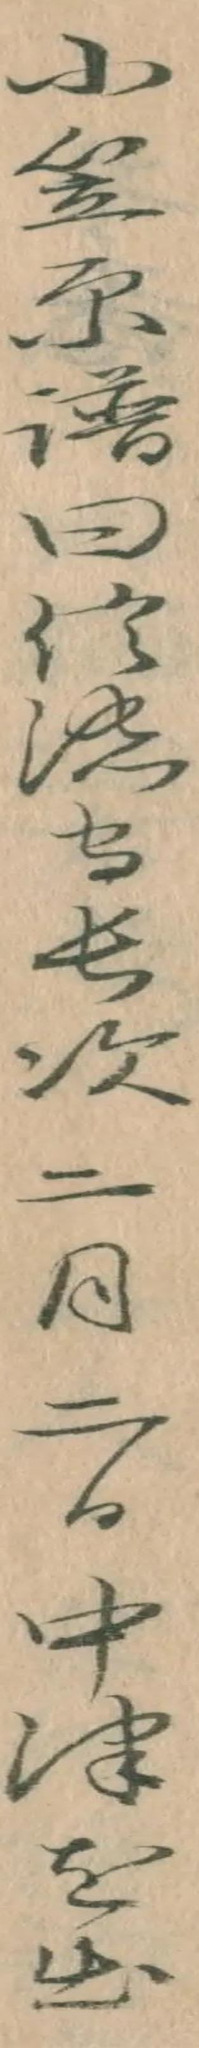小笠原譜曰信濃守長次二月二日中津を出
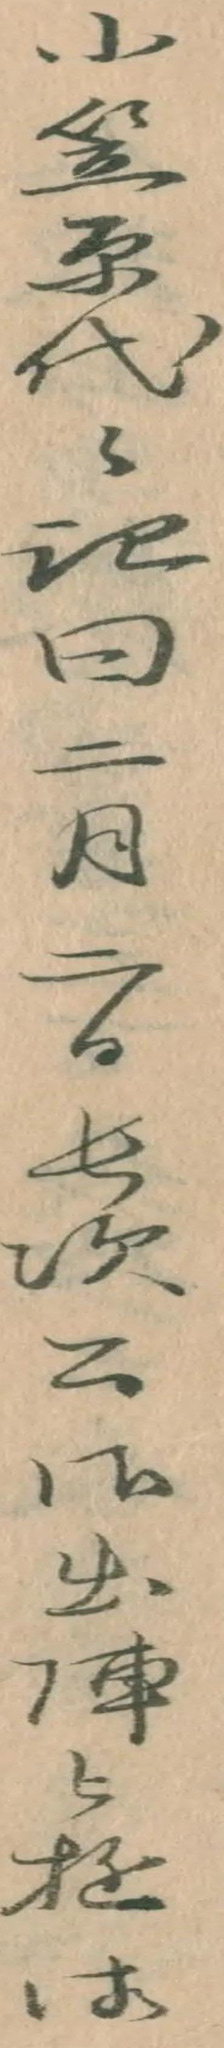小笠原代々記曰二月二日長次公御出陣被遊御

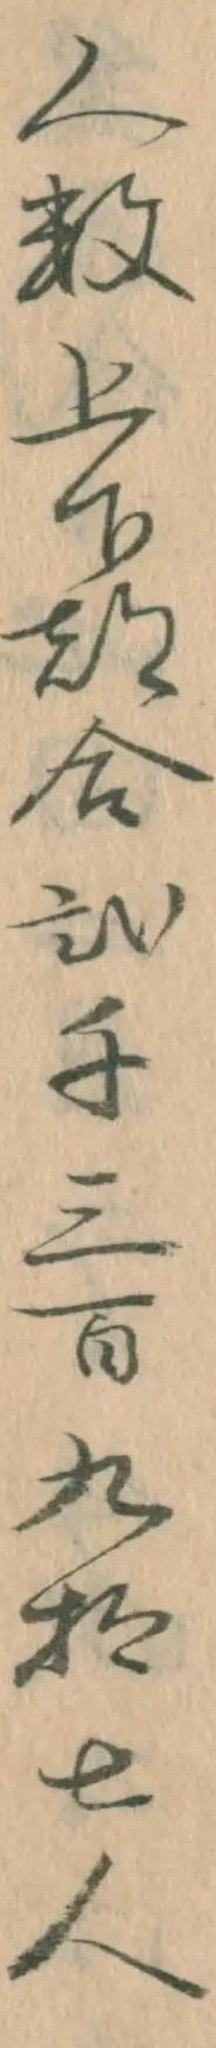人数上下都合弐千三百九拾七人
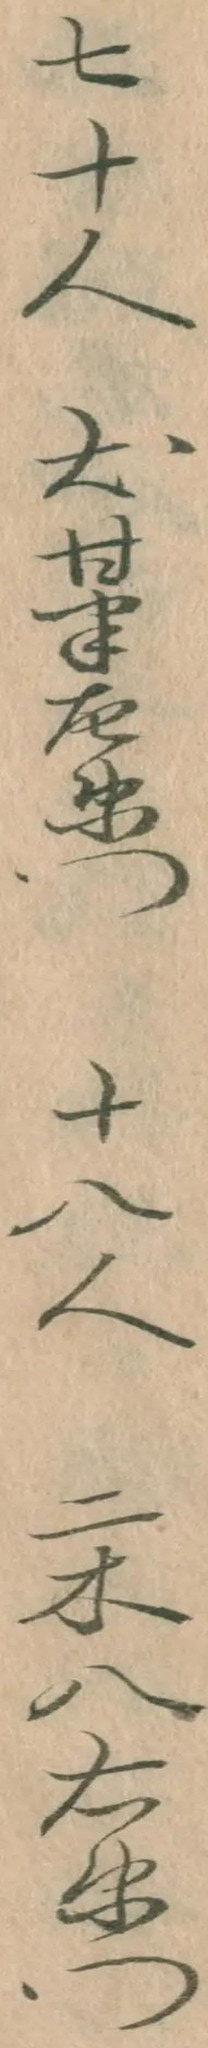七十人犬甘半左衛門十八人二木八右衛門
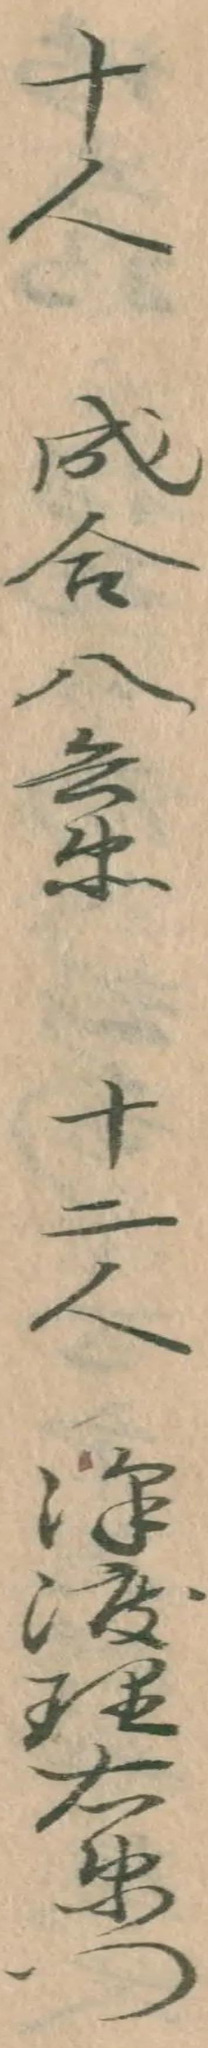十人成合八兵衛十二人沢渡理右衛門
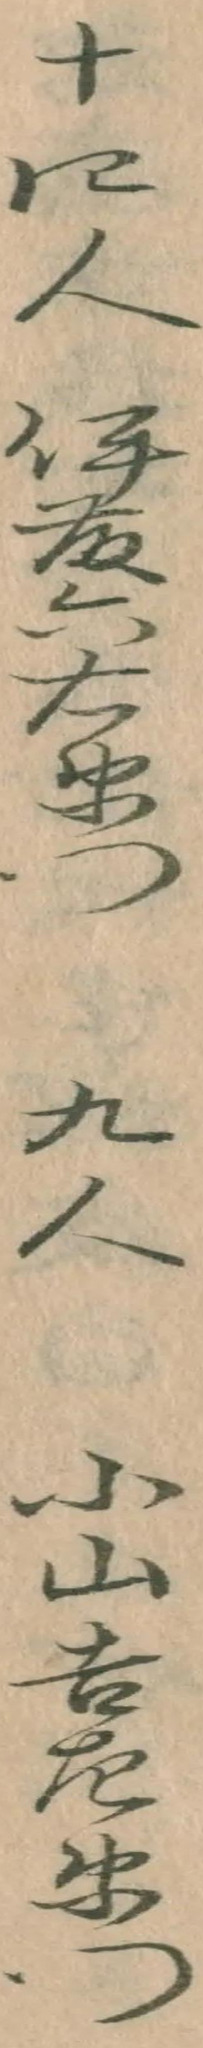十四人伊藤六右衛門九人小山吉左衛門
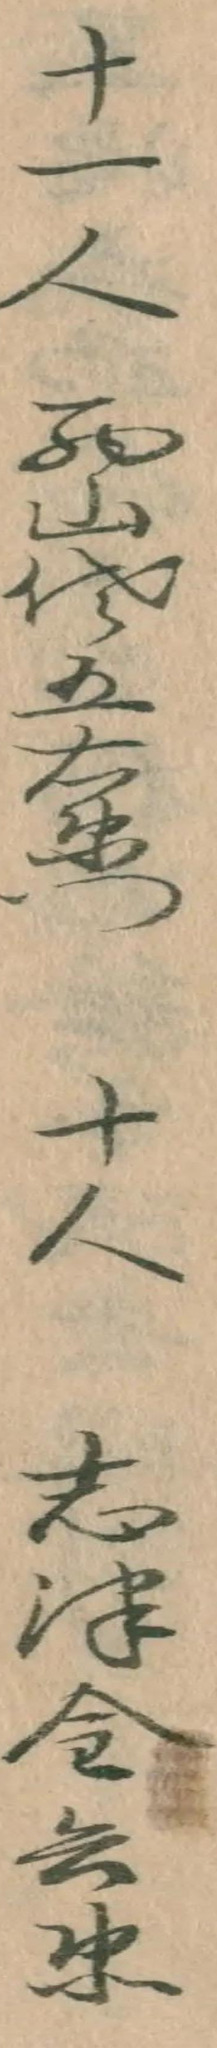十一人西山佐五右衛門十人志津金兵衛
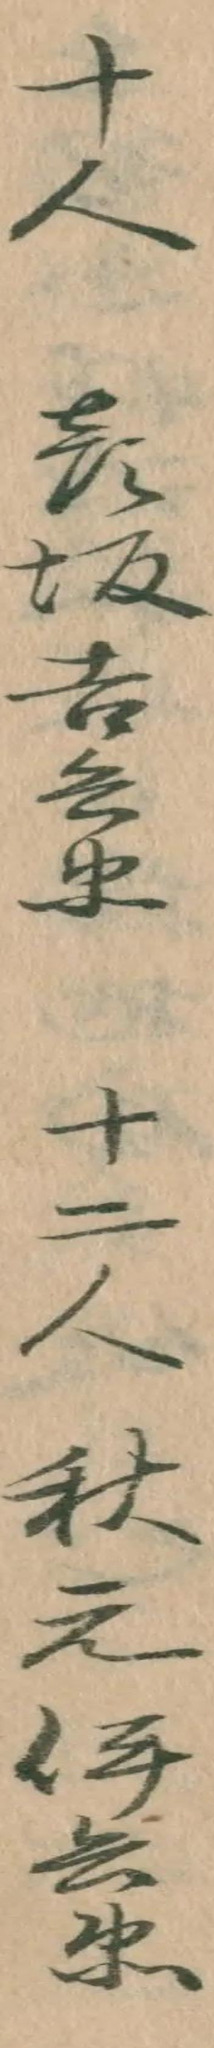十人彦坂吉兵衛十二人秋元伊兵衛
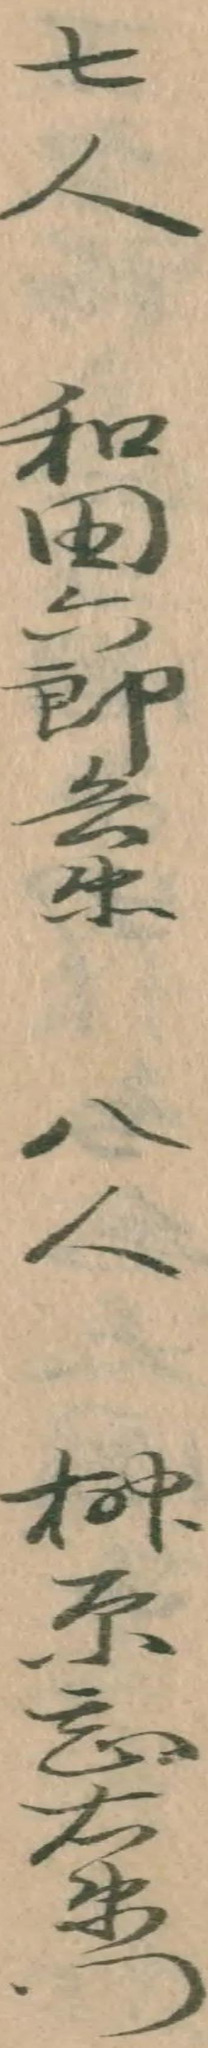七人和田六郎兵衛八人榊原甚右衛門
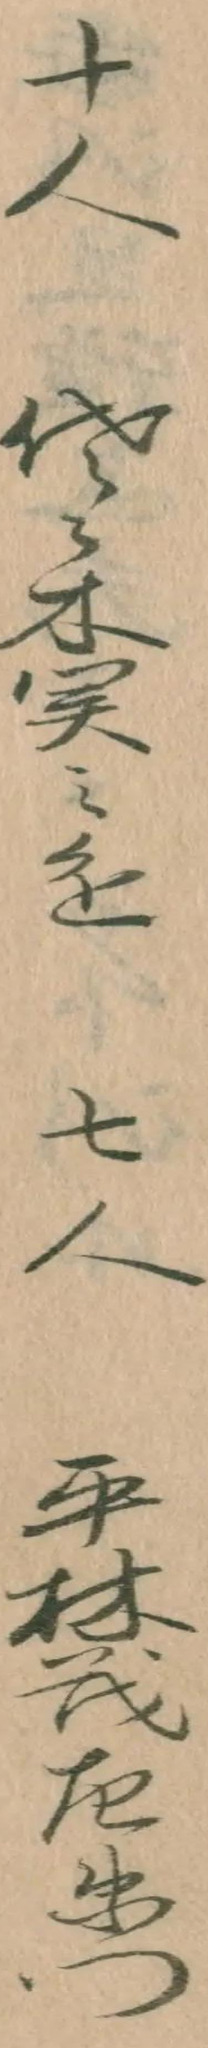十人佐々木関之進七人平林茂左衛門
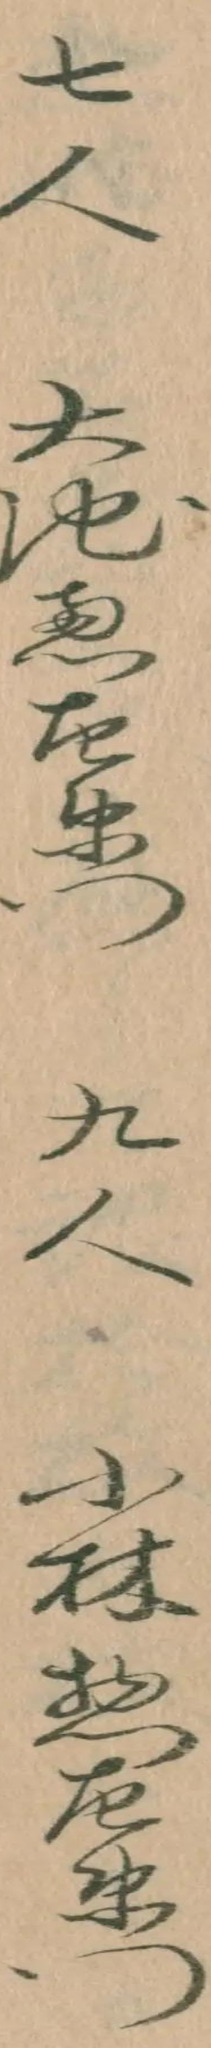七人大池恵左衛門九人小林惣左衛門
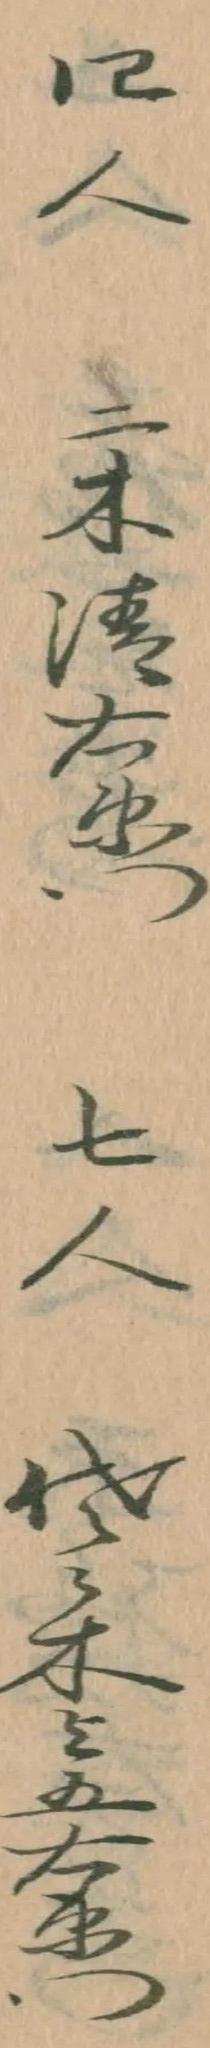四人二木清右衛門七人佐々木与五右衛門
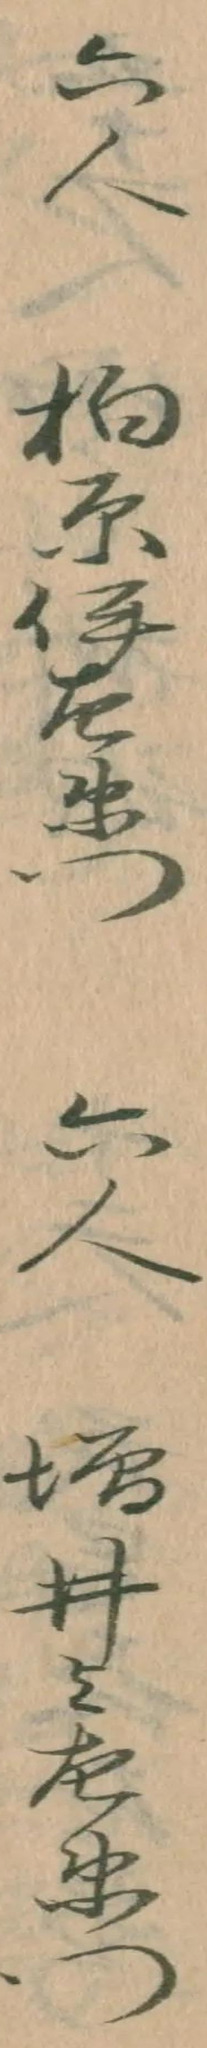六人柏原伊左衛門六人増井与左衛門
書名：切支丹御退治記 49巻. [6]
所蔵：国立国会図書館 National Diet Library, JAPAN
